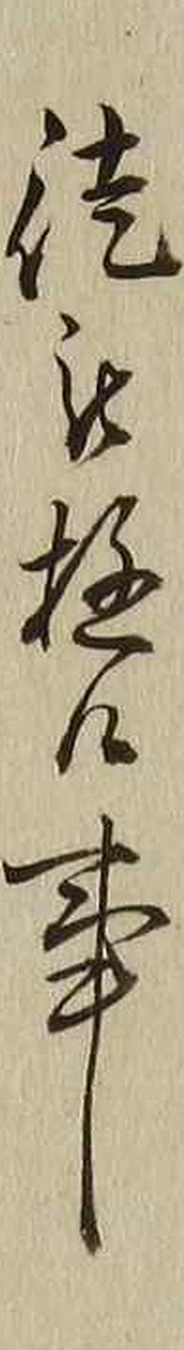徒被遊候事
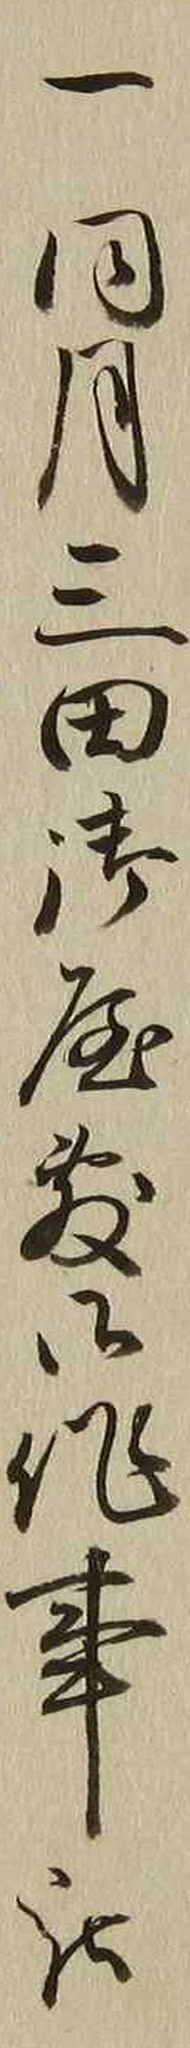一同月三田御屋敷御作事被
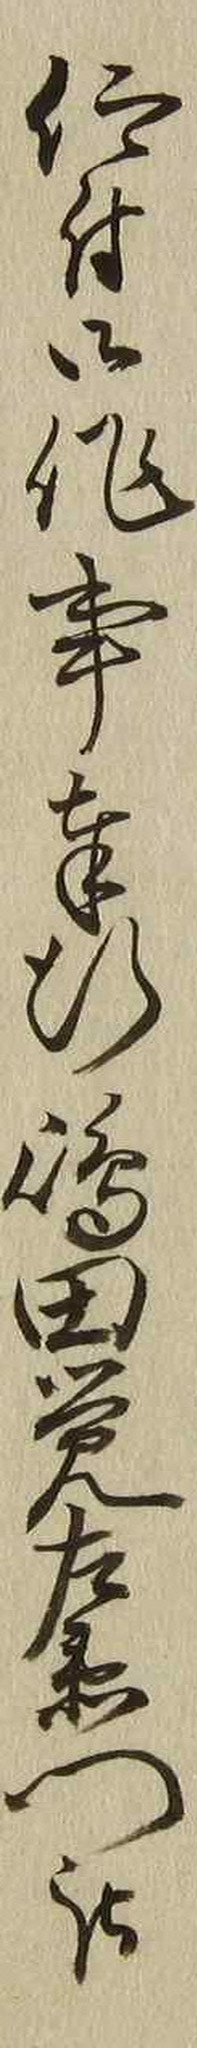仰付御作事奉行嶋田覚左衛門被
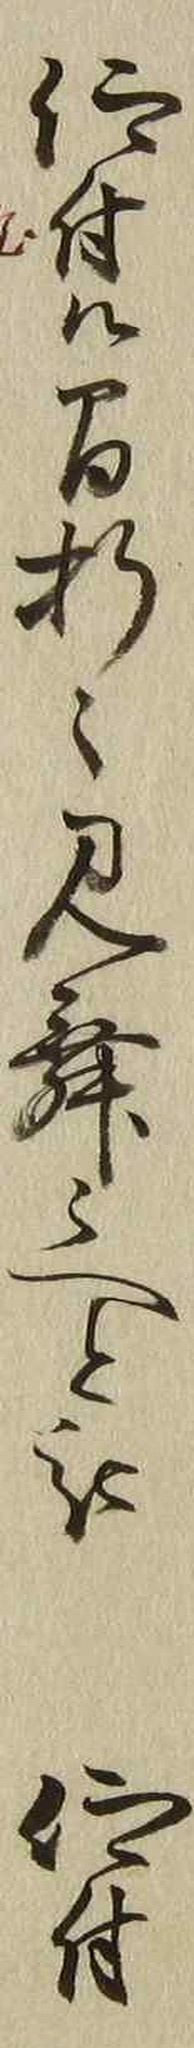仰付候間折々見舞候へと被仰付
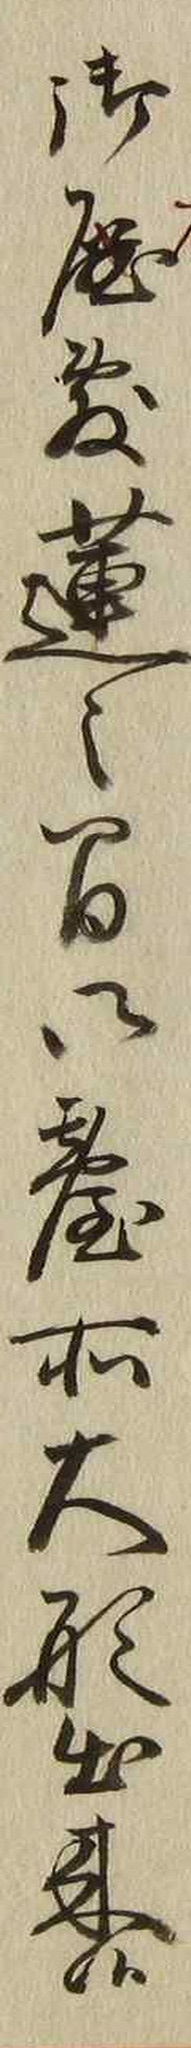御屋敷蓮之間御台所大形出来候
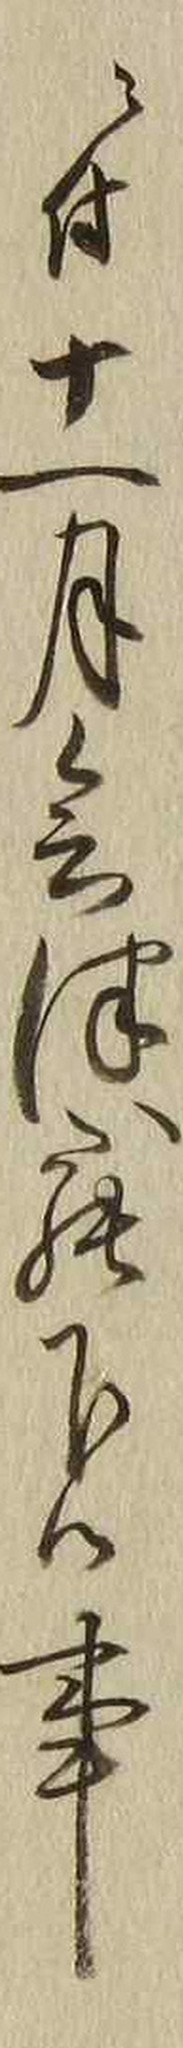ニ付十一月会津へ罷下候事
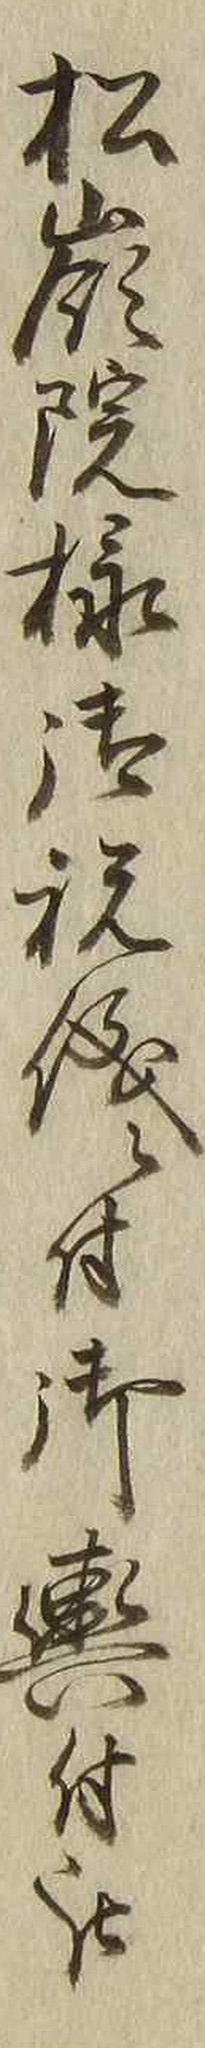松嶺院様御祝儀ニ付御輿付被
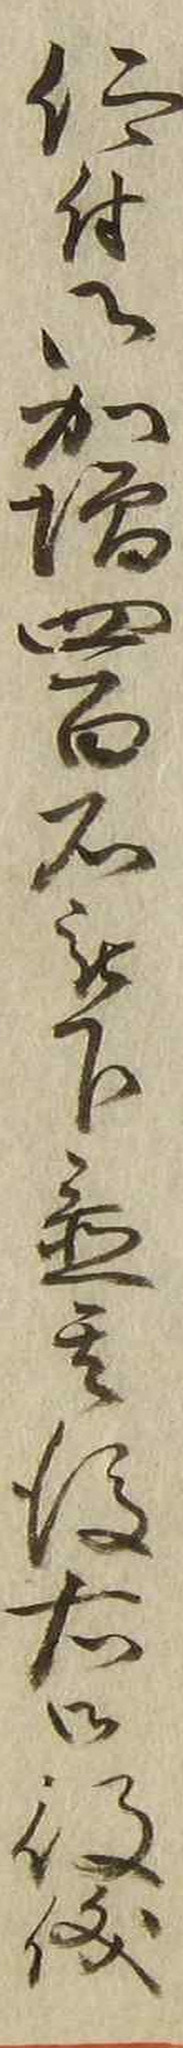仰付御加増四百石被下置其後右御役儀
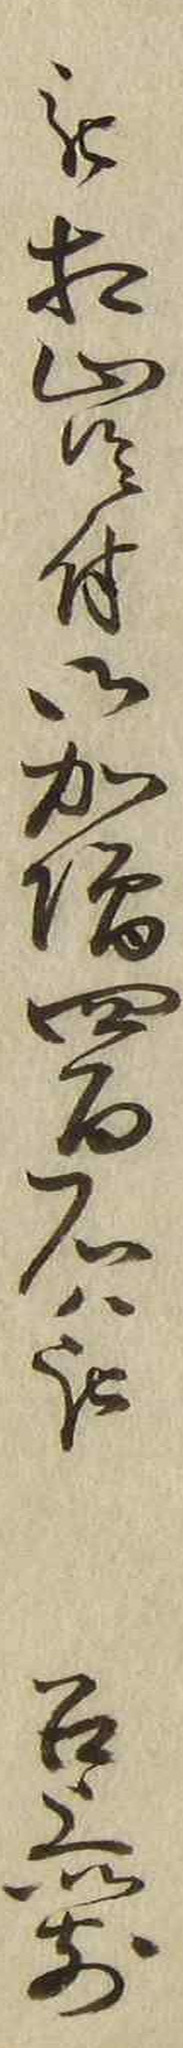被相止候ニ付御加増四百石ハ被召上以前

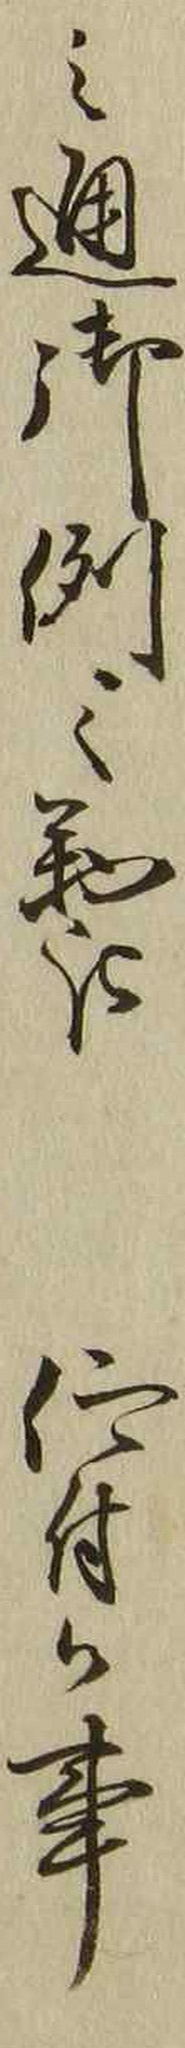之通御例之勤被仰付候事
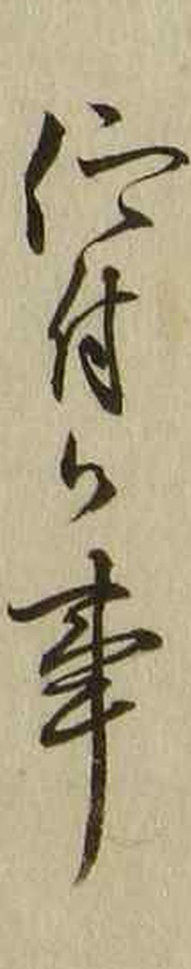仰付候事
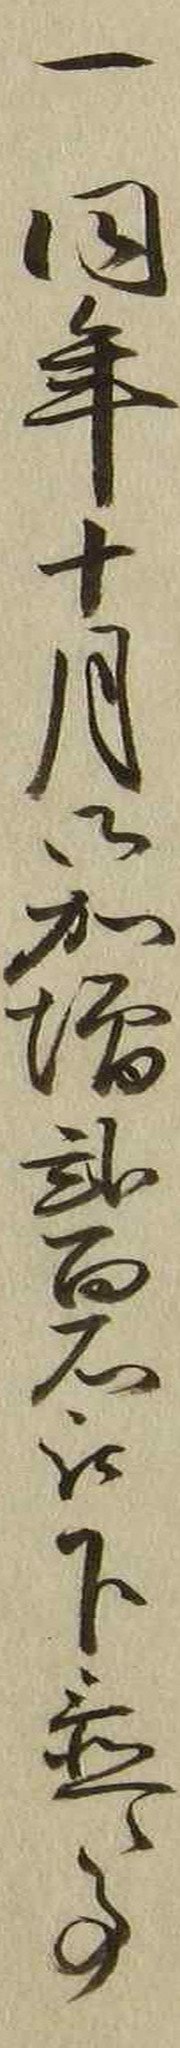一同年十月御加増弐百石被下置候事
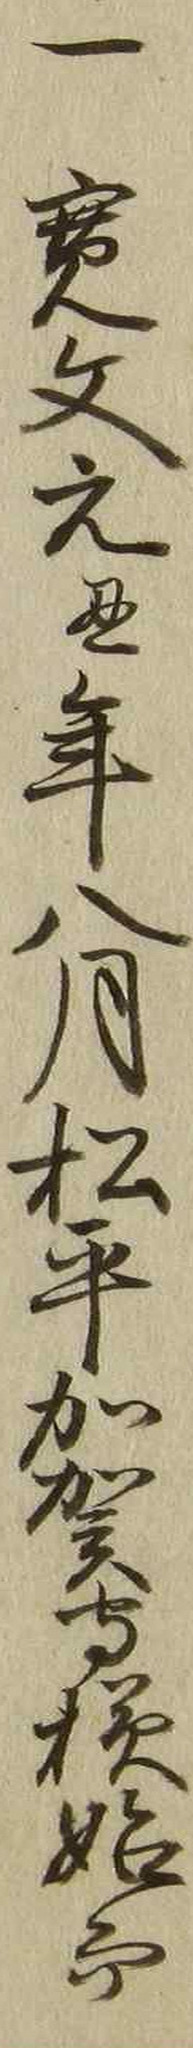一寛文元丑年八月松平加賀守様始而
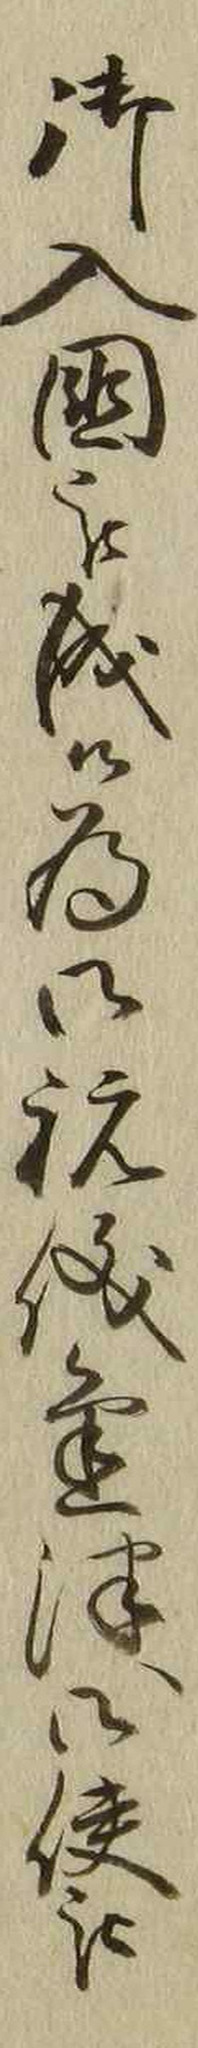御入国被成候為御祝儀金津へ御使被
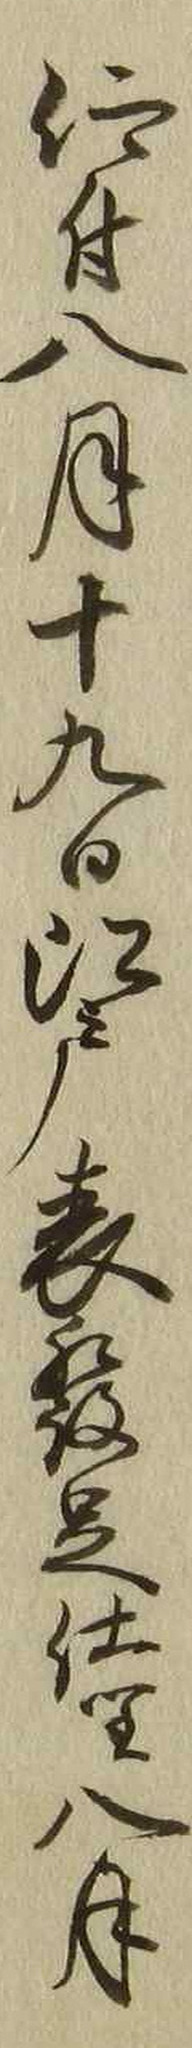仰付八月十九日江戸表発足仕閏八月
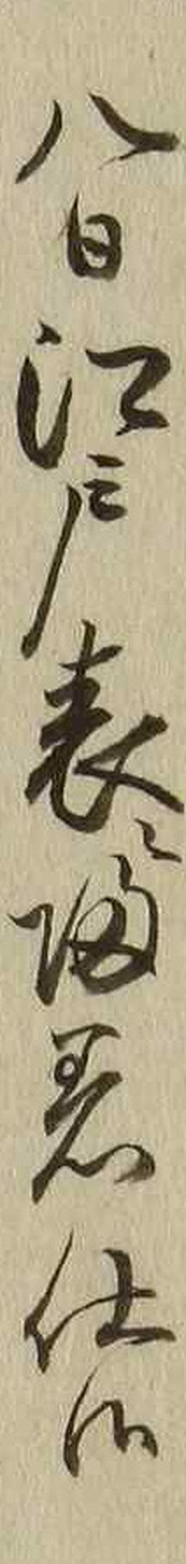八日江戸表ニ帰着仕候
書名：諸士系譜　巻之60　と之部3
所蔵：会津若松市立会津図書館
